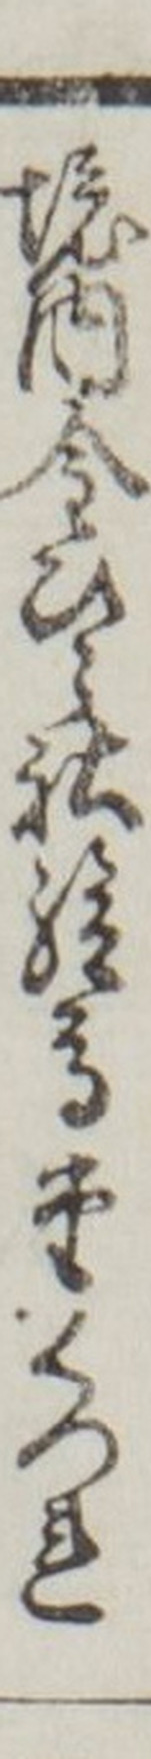境内金ひら社絵馬堂くづれ
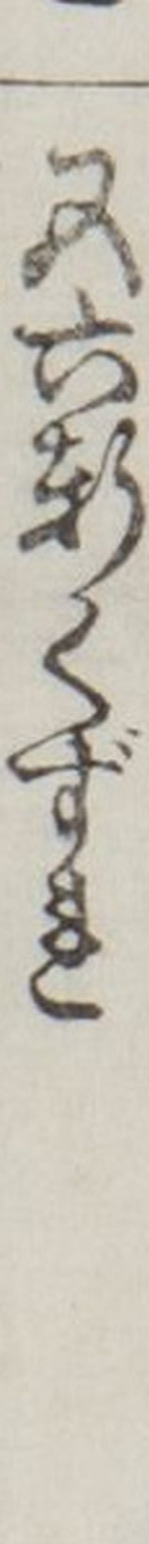五六軒くずれ
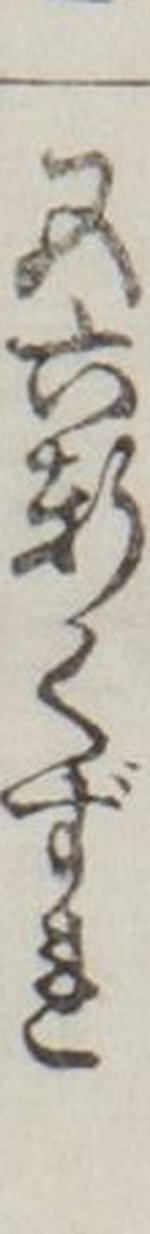五六軒くずれ
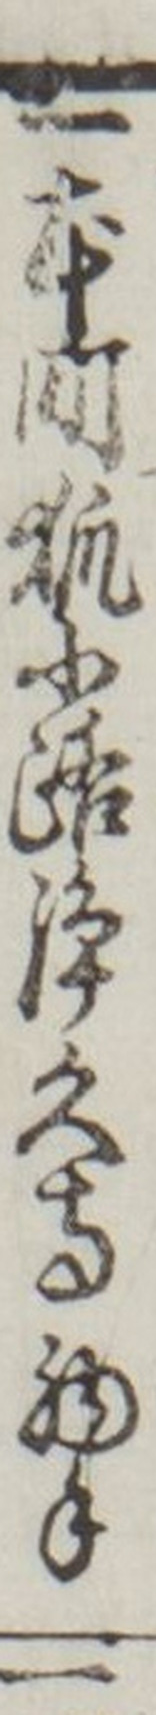一本町狐小路浄久寺西手
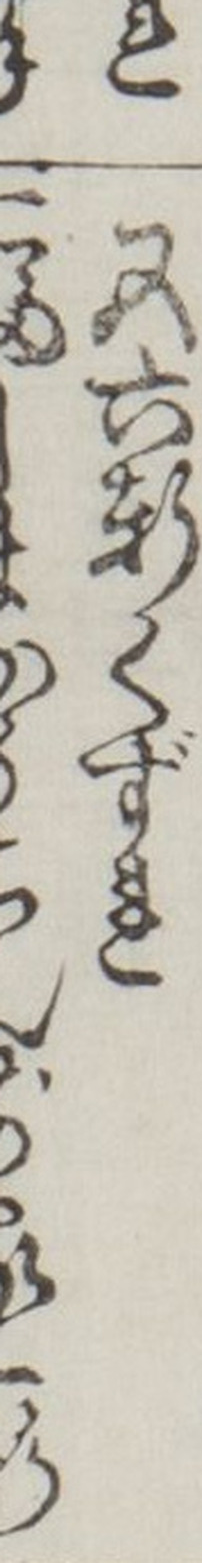五六軒くずれ
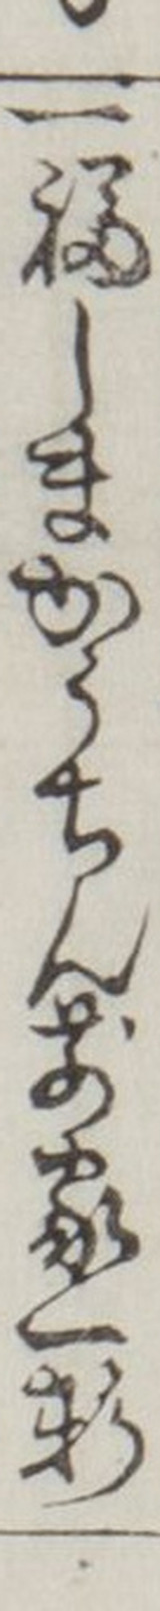一福しまかうちん前家一軒
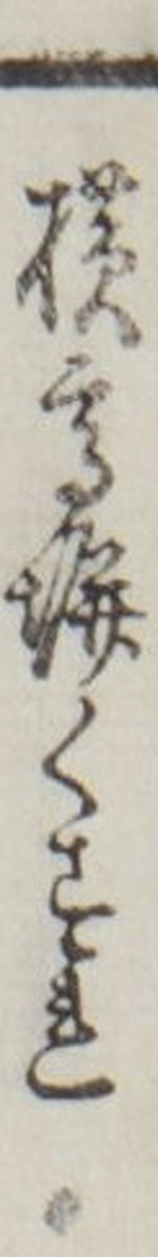横高塀くすれ
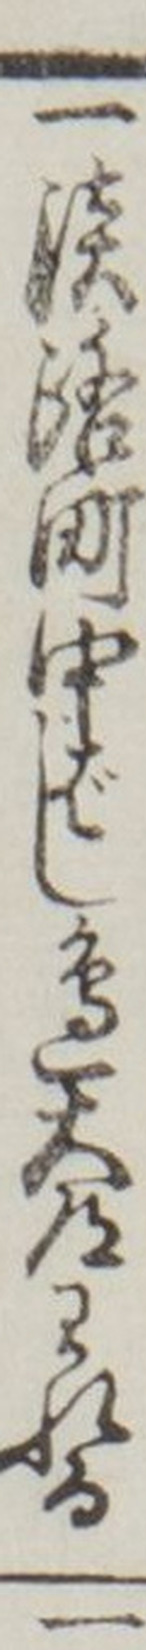一淡路町中ばし辺大道われる
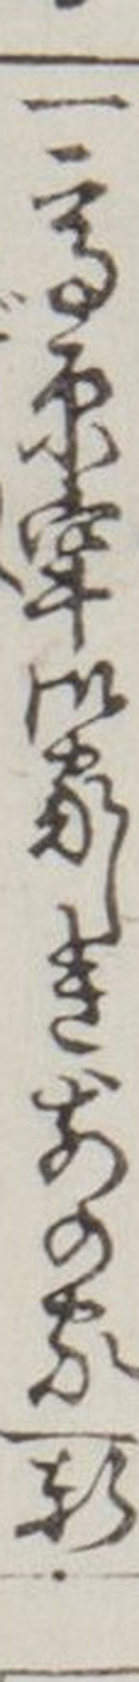一高原牢御家しき前の家一軒
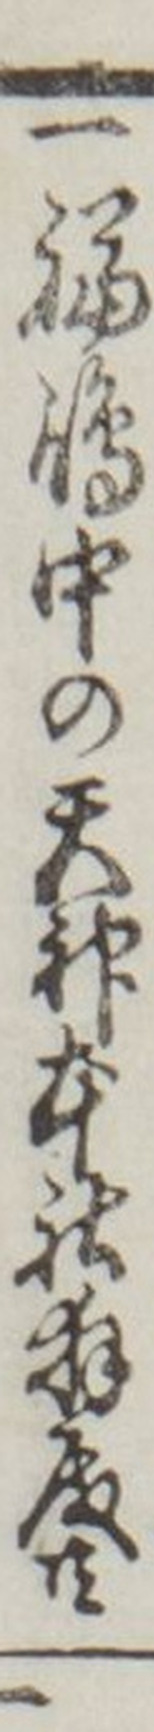一福嶋中の天神本社拝殿共
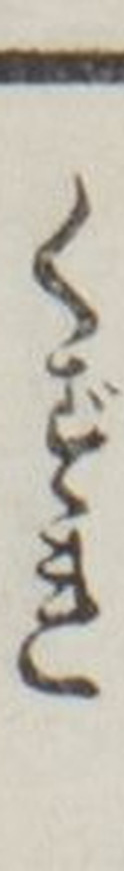くずれ
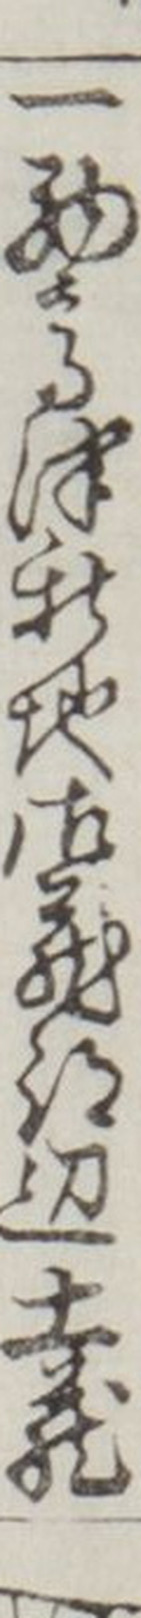一西高津社地御蔵跡辺土蔵
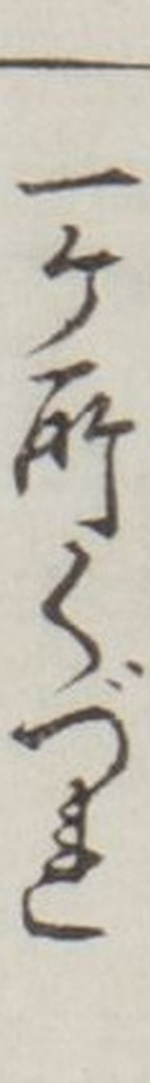一ヶ所くづれ
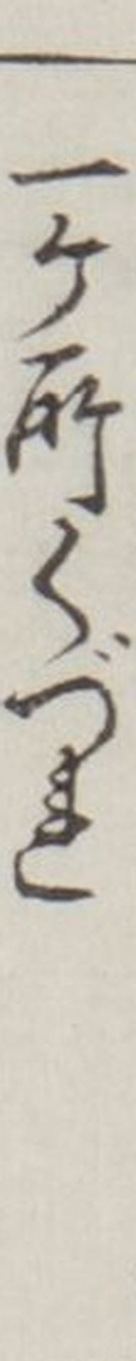一ヶ所くづれ
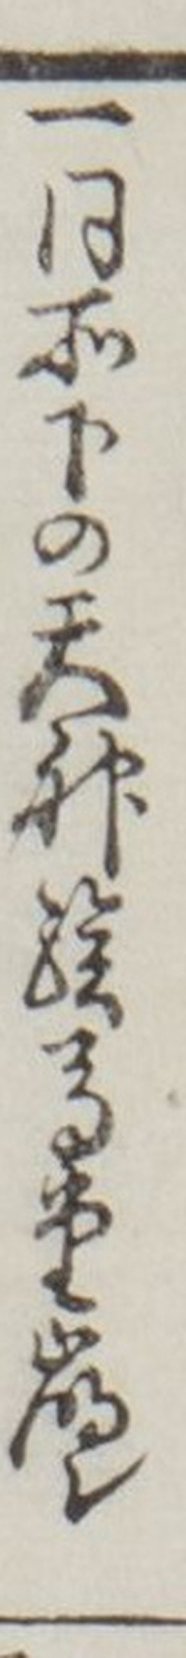一同所下の天神絵馬堂崩れ
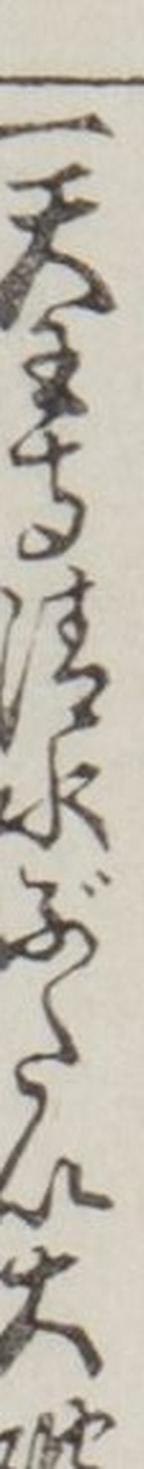一天王寺清水ぶたい大破
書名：本志らべ大阪大地震大破略記
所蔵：あいおいニッセイ同和損保株式会社
